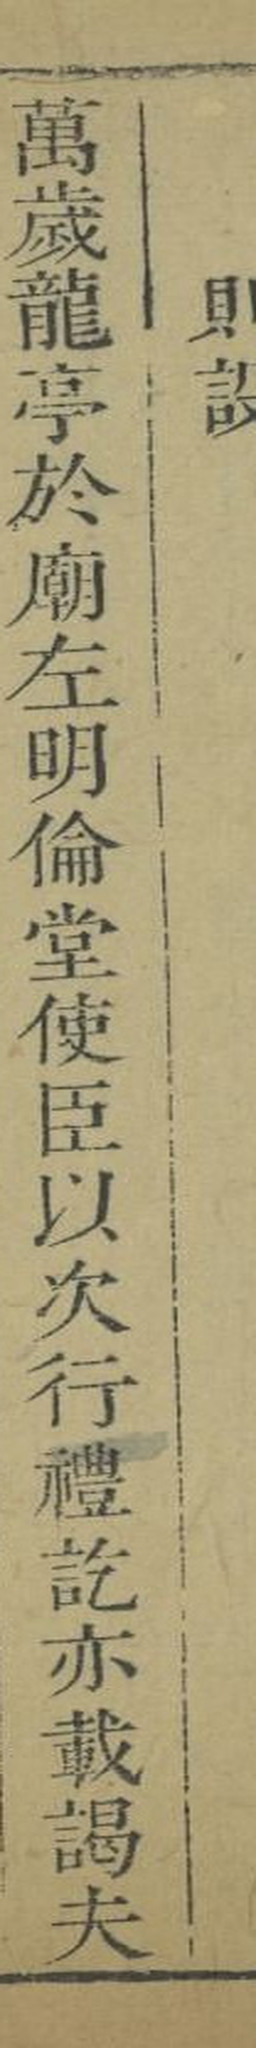萬歲龍亭於廟左明倫堂使臣以次行禮訖亦載謁夫
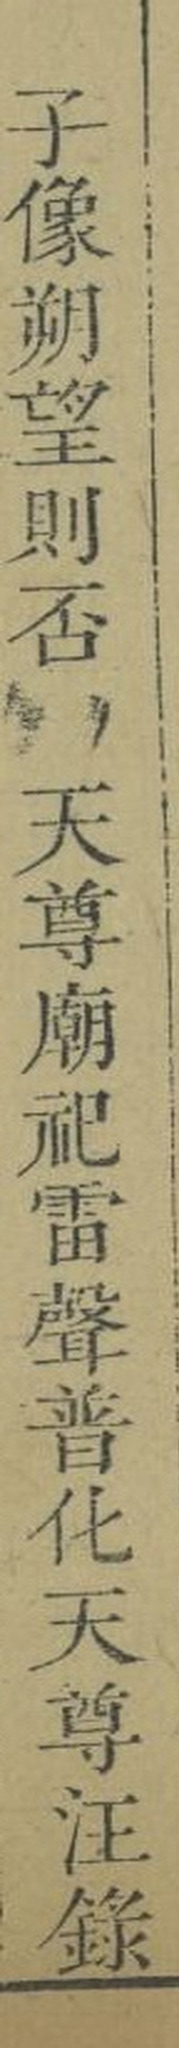子像朔望則否天尊廟祀雷聲普化天尊汪錄
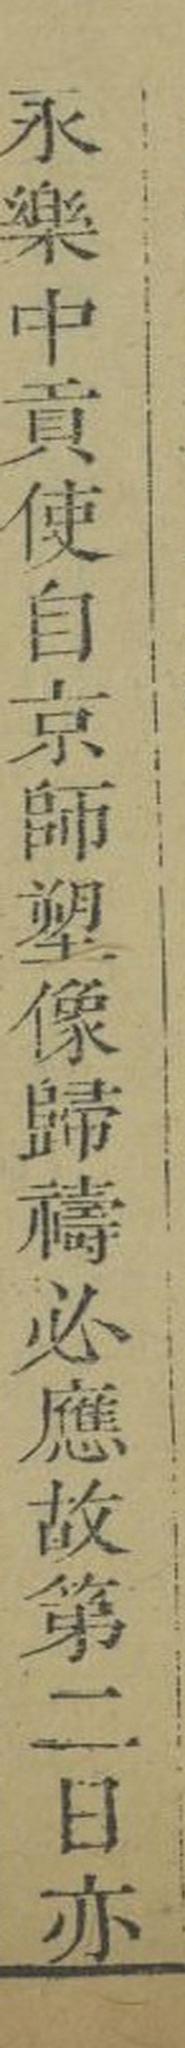永樂中貢使自京師塑像歸禱必應故第二日亦
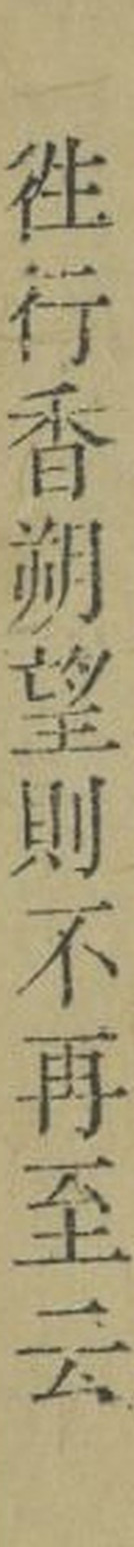徃行香朔望則不再至云

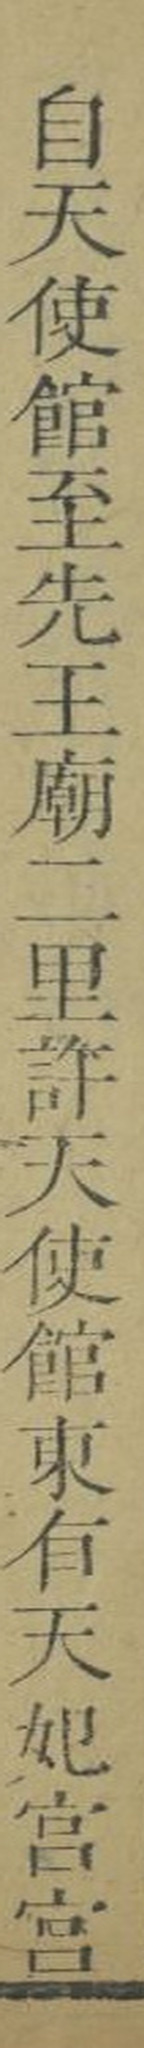自天使館至先王廟二里許天使館東有天妃宫宫
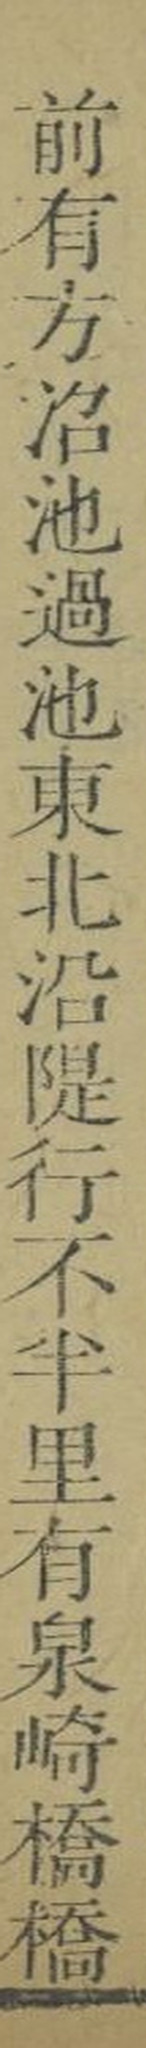前有方沼池過池東北沿隄行不半里有泉崎橋橋
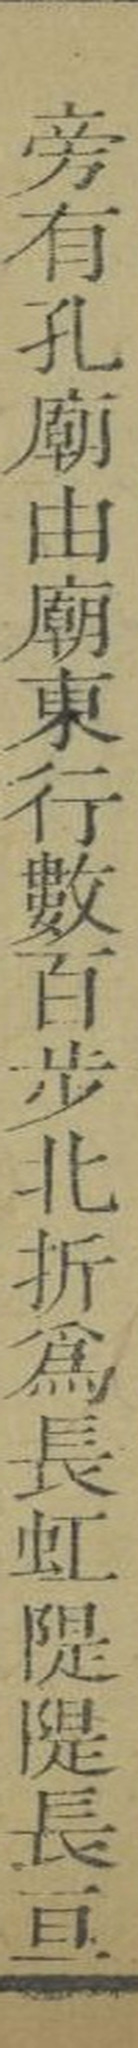旁有孔廟由廟東行數百步北折爲長虹隄隄長亘
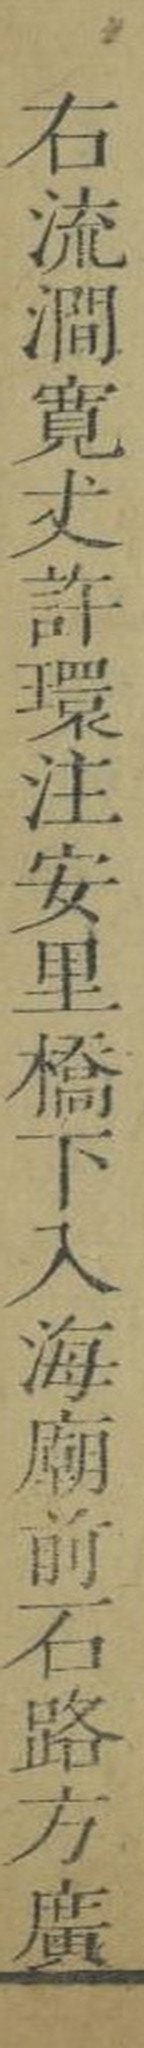右流澗寛丈許環注安里橋下入海廟前石路方廣
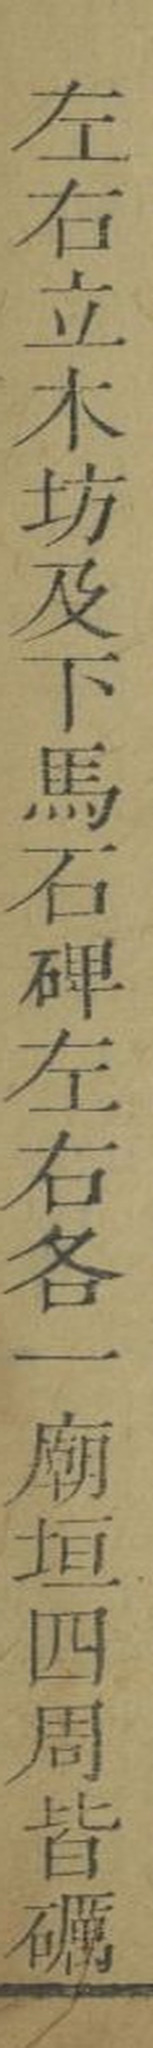左右立木坊及下馬石碑左右各一廟垣四周皆礪

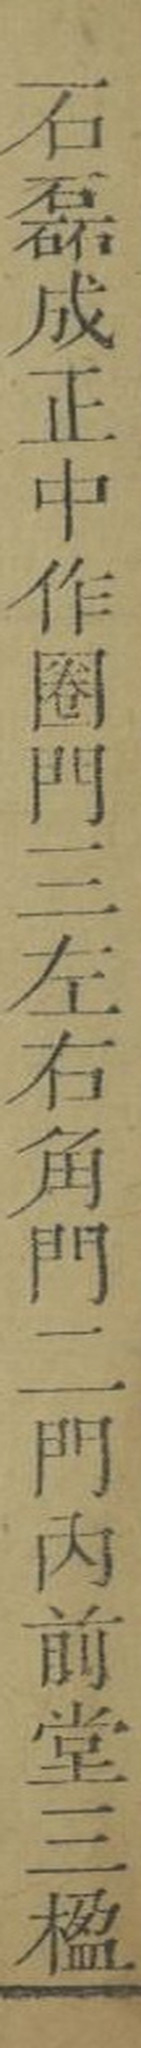石磊成正中作圏門三左右角門二門内前堂三楹
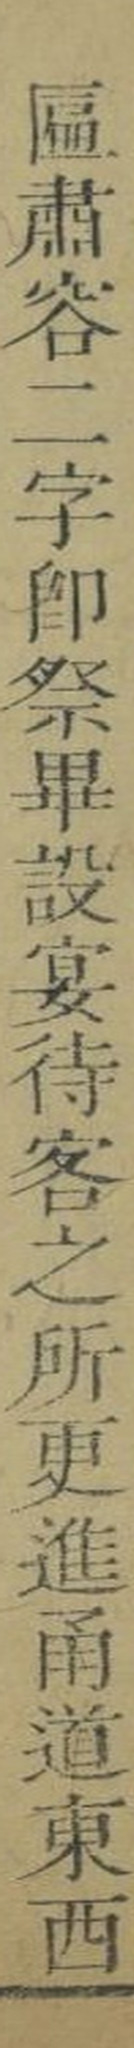匾肅容二字卽祭畢設宴待客之所更進甬道東西
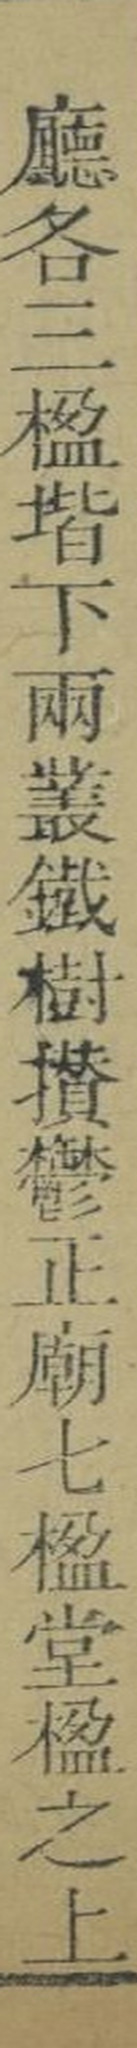廳各三楹堦下兩叢鐵樹攅鬱正廟七楹堂楹之上
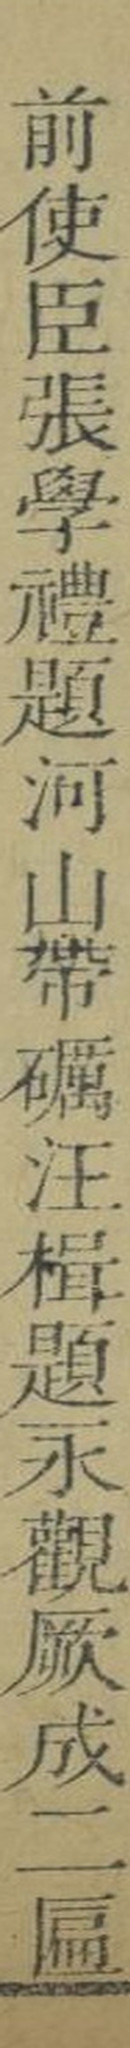前使臣張學禮題河山帶礪汪楫題永觀厥成二匾
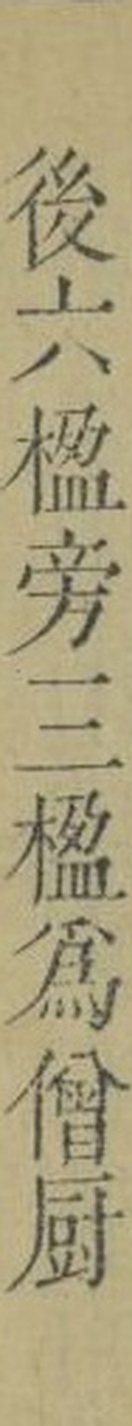後六楹旁三楹爲僧厨
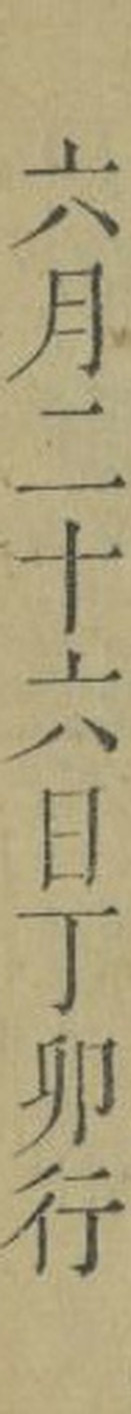六月二十六日丁卯行
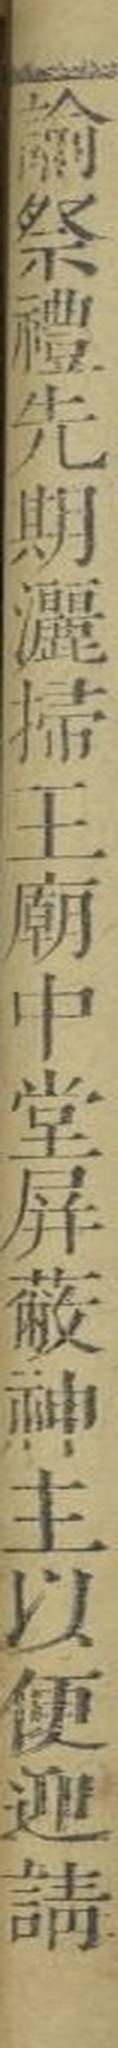諭祭禮先期灑掃王廟中堂屏蔽神主以更迎請
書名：中山伝信録 巻二
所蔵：University of the Ryukyus Library
